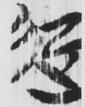起
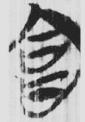合
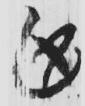臣
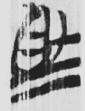爲
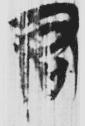君
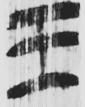王
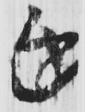臣
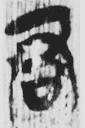君
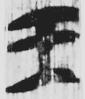王
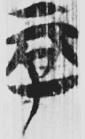{亓子}（免）
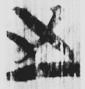之
